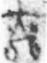○（令）
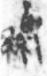弘
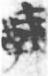所
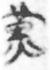黃
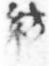紡
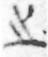之
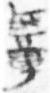○（緅）
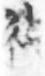紳（靷）
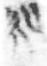紃
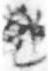○（豻）
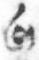首
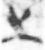之
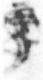○（蒙）
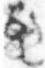○（貂）
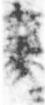騬
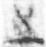之
